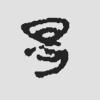日月
